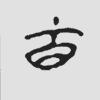七日
